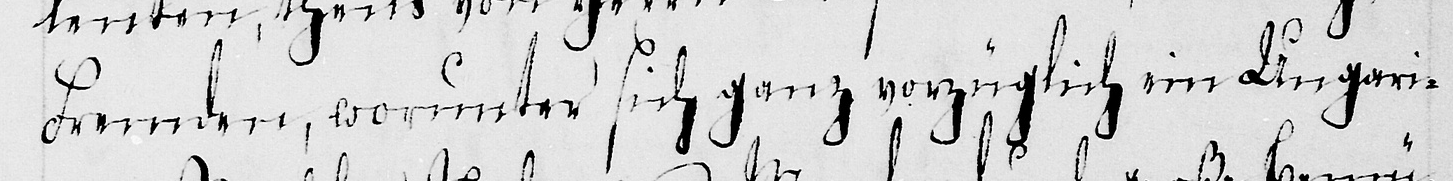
Fremden, worunter sich ganz vorzüglich ein Ungari¬
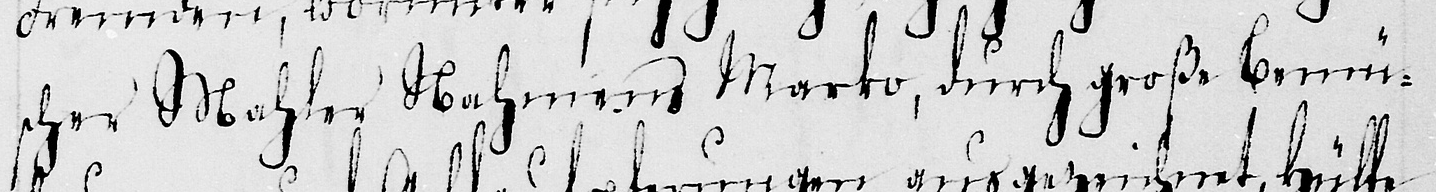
scher Mahler Nahmens Marko, durch große Bemü¬
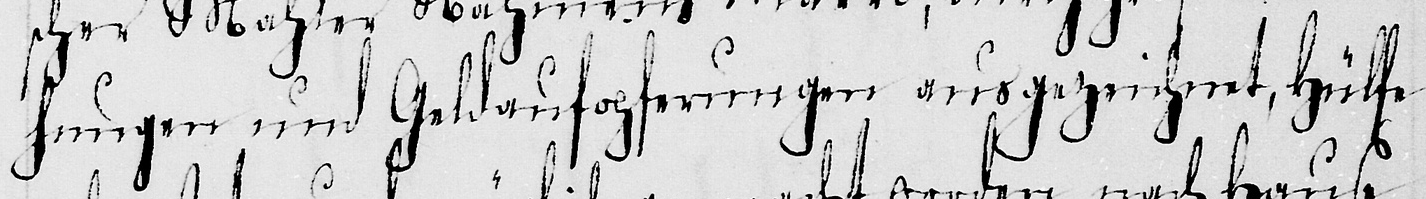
hungen und Geldaufopferungen ausgezeichnet, Hülfe
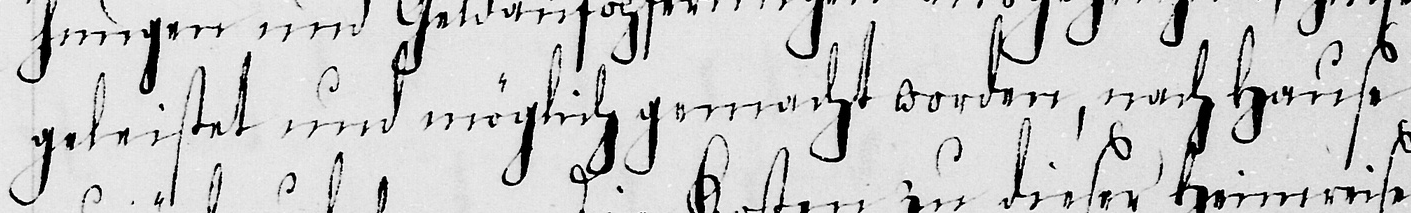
geleistet und möglich gemacht worden, nach Hause
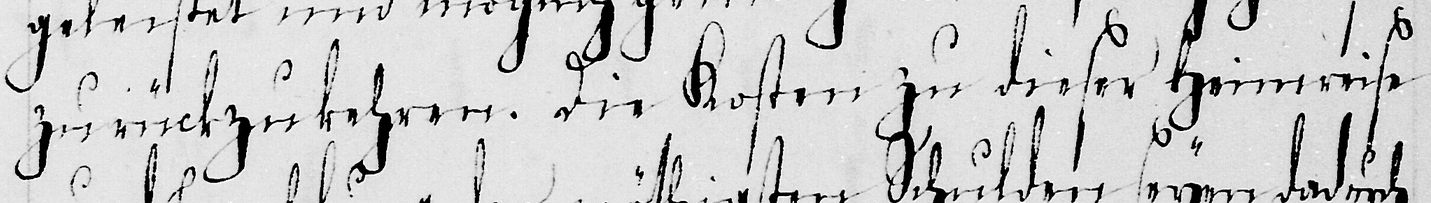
zurückzukehren. Die Kosten zu dieser Heimreise
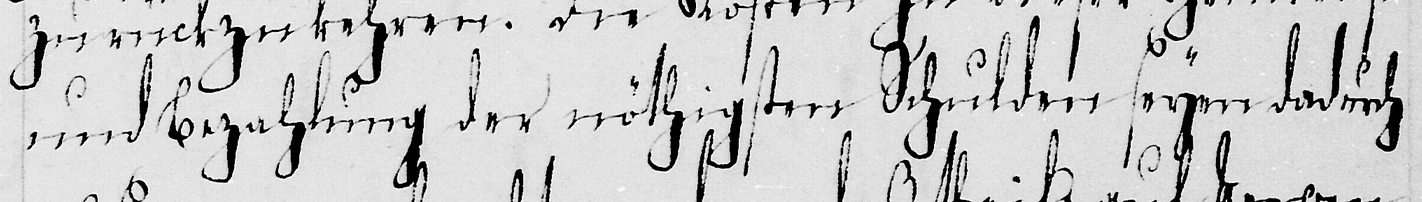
und Bezahlung der nöthigsten Schulden seyen dadurch
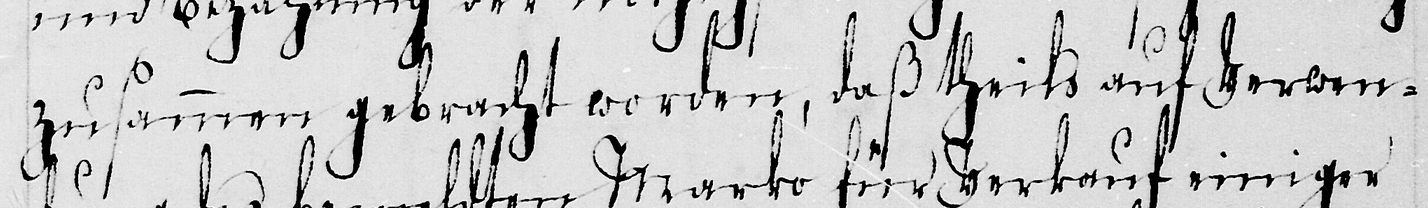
zusammen gebracht worden, daß theils auf Verwen¬
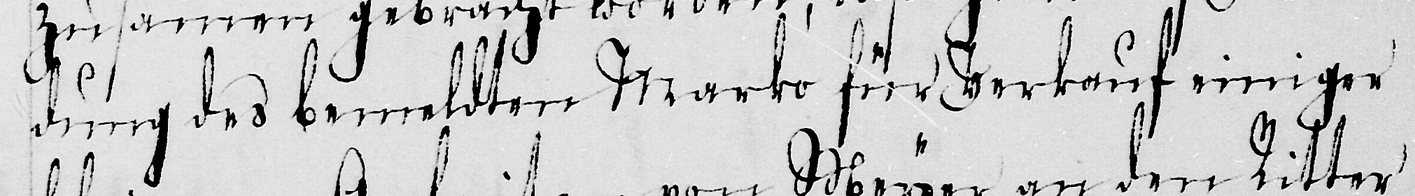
dung des bemeldten Marko für Verkauf einiger
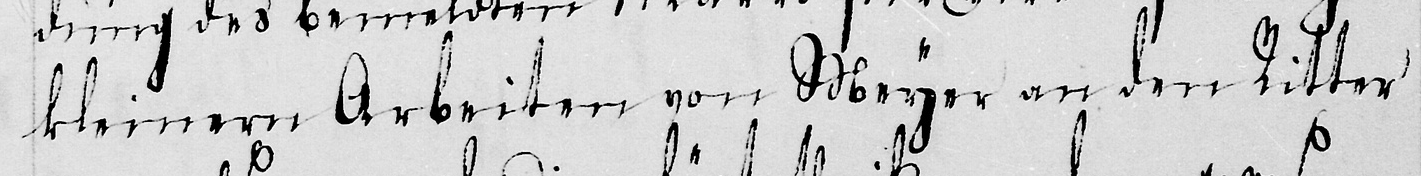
kleinen Arbeiten von Meyer an den Ritter
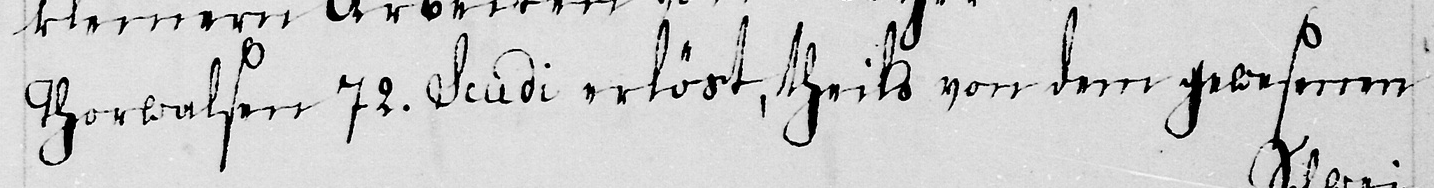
Thorwalsen 72. Scudi erlöst, theils von dem gewesenen
